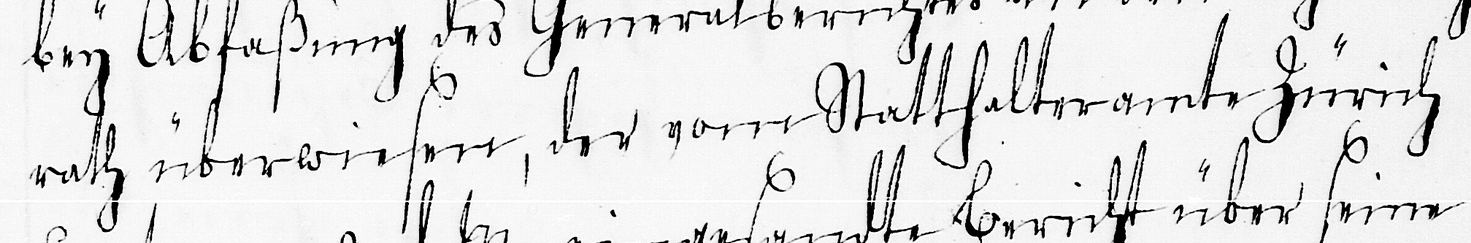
rath überwiesen, der vom Statthalteramte Zürich
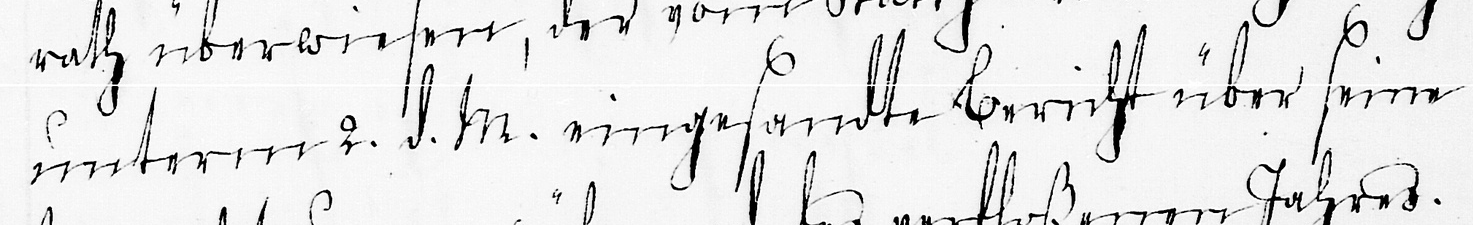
unterm 2. d. M. eingesandte Bericht über seine
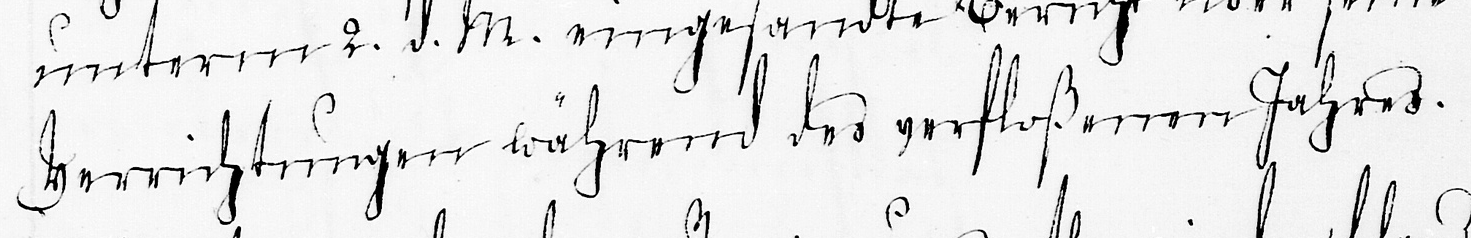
Verrichtungen während des verfloßenen Jahres.
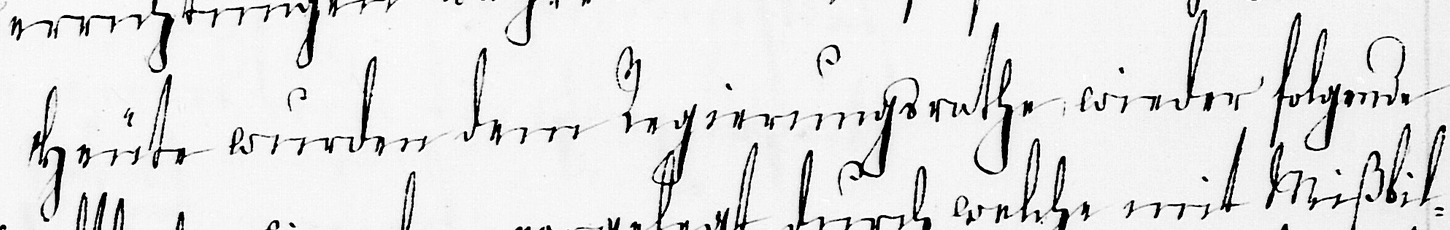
Heute wurden dem Regierungsrathe wieder folgende
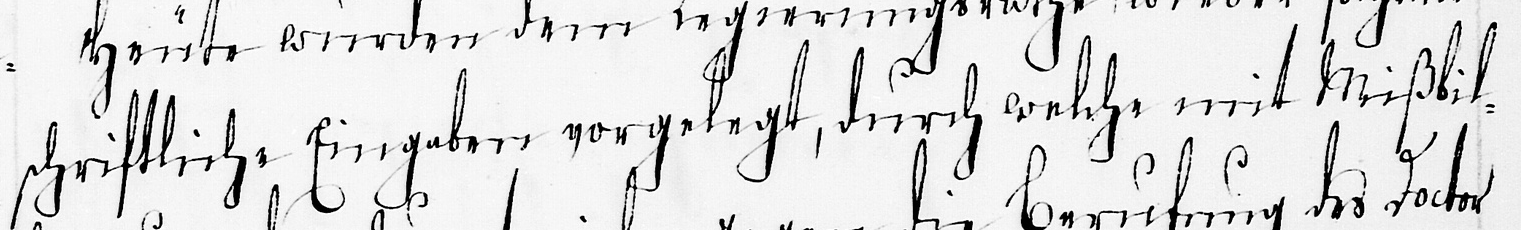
schriftliche Eingaben vorgelegt, durch welche mit Mißbil¬
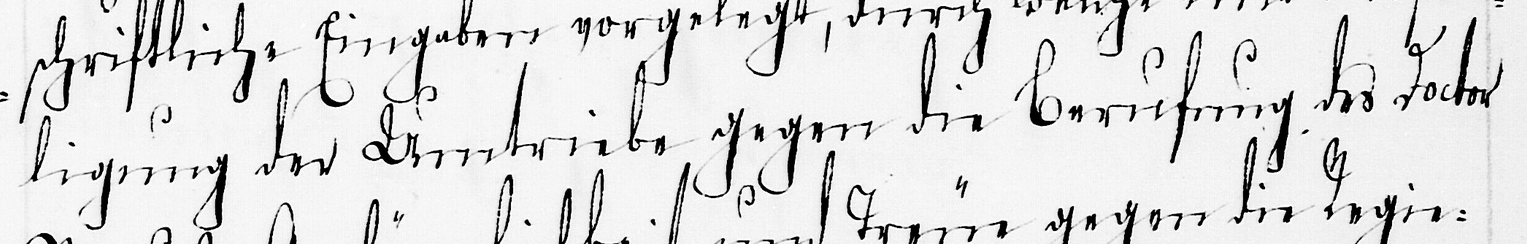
ligung der Umtriebe gegen die Berufung des Doctor
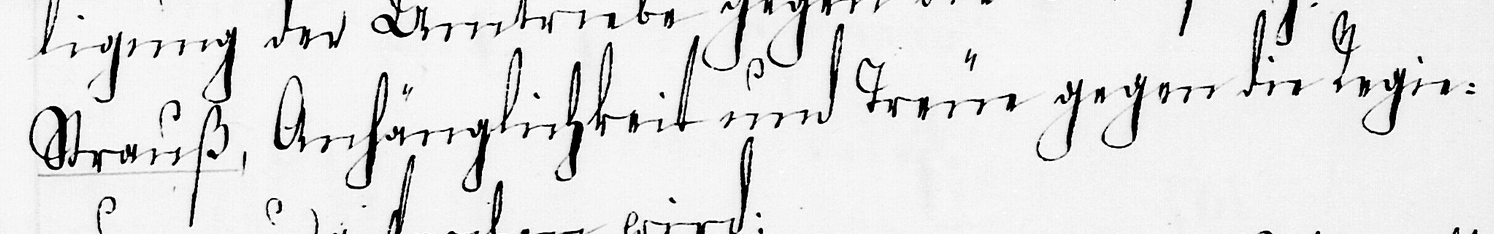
Strauß, Anhänglichkeit und Treue gegen die Regie¬
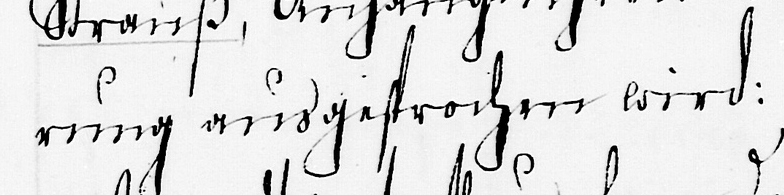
rung ausgesprochen wird:
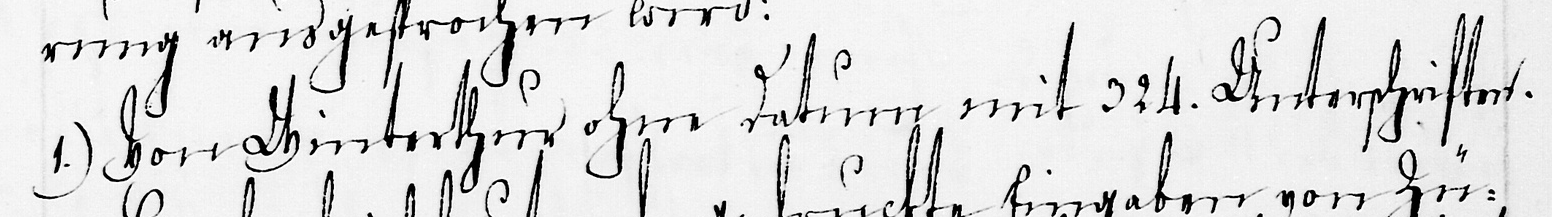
1.) Von Winterthur ohne Datum mit 324. Unterschriften.
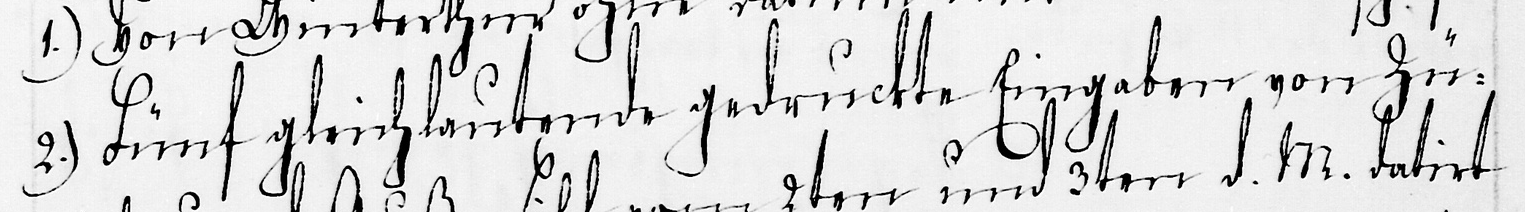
2.) Fünf gleichlautende gedruckte Eingaben von Zü¬
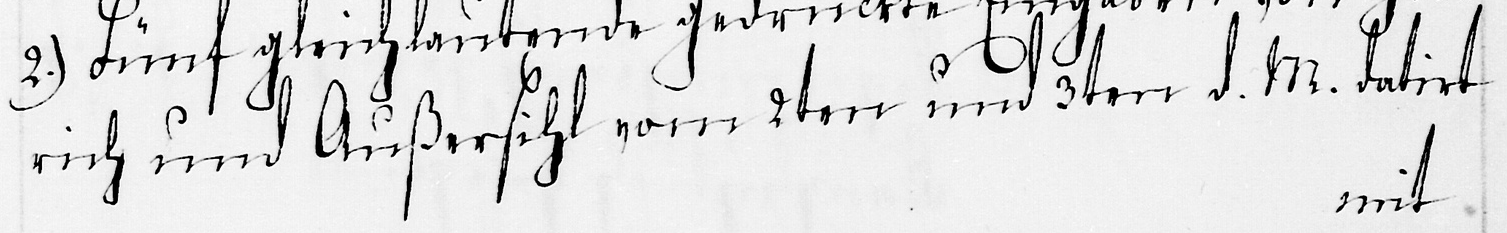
rich und Außersihl vom 2ten und 3ten d. M. datirt
